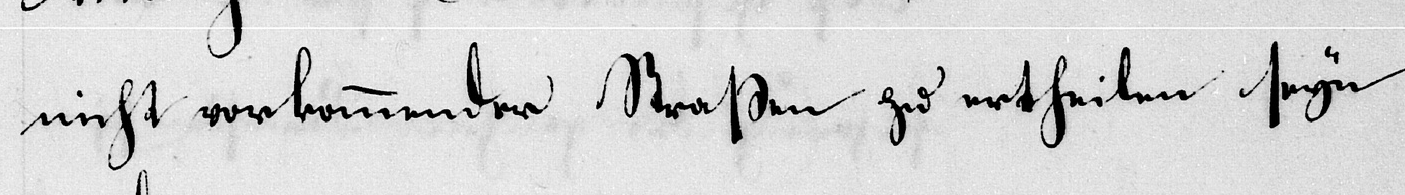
nicht vorkommenden Straßen zu ertheilen seyn
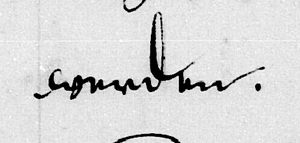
werden.
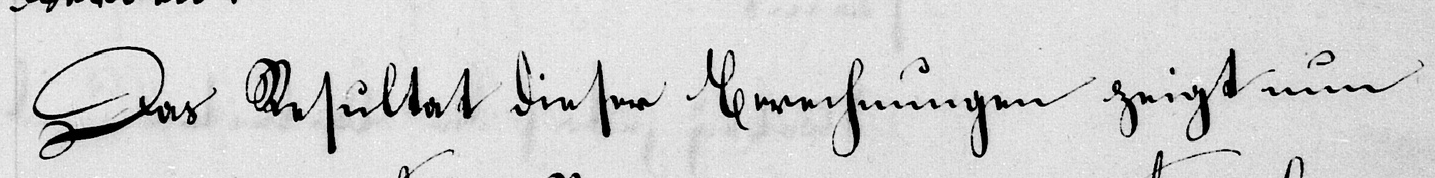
Das Resultat dieser Berechnungen zeigt nun
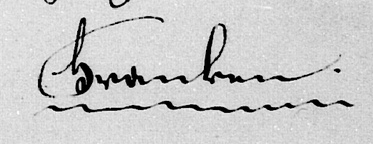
Franken.
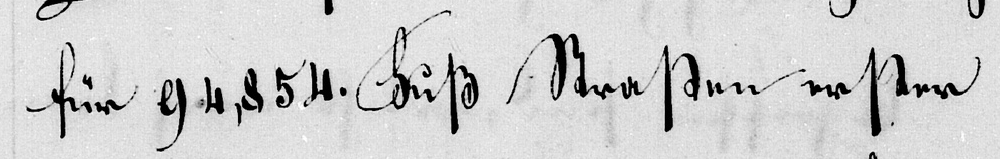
für 94,854. Fuß Straßen erster
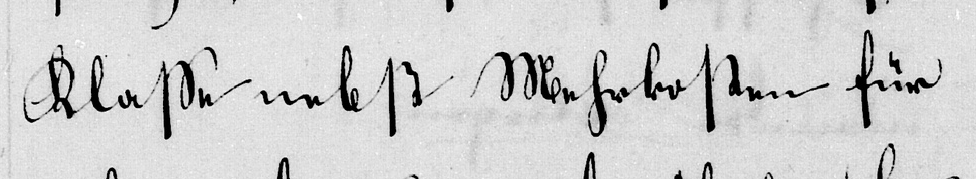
Klaße nebst Mehrkosten für
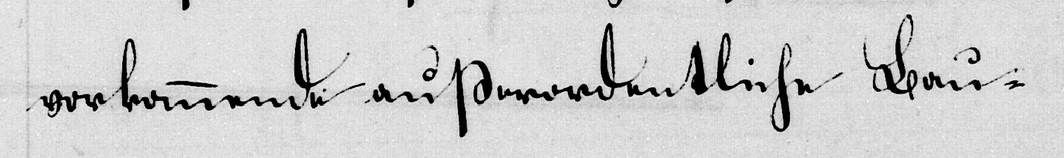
vorkommende außerordentliche Bau¬
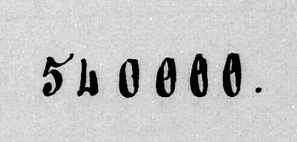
540000.
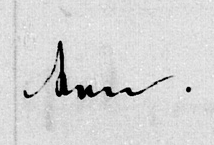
ten
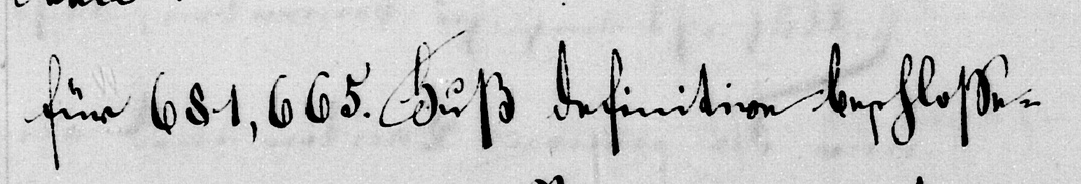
für 681,665. Fuß definitiv beschloße¬
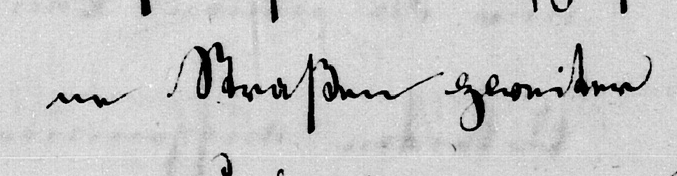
ner Straßen zweiter
